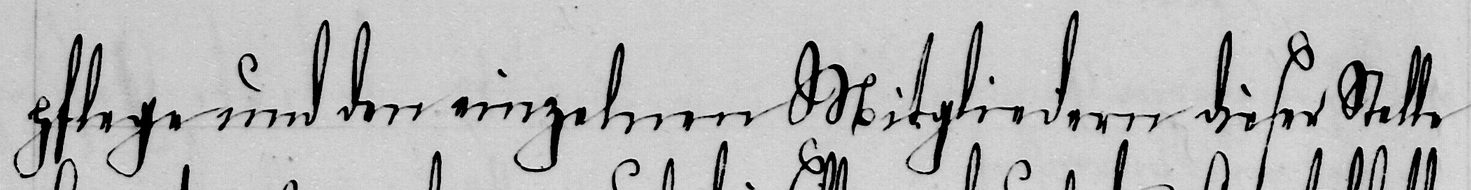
pflege und den einzelnen Mitgliedern dieser Stel¬
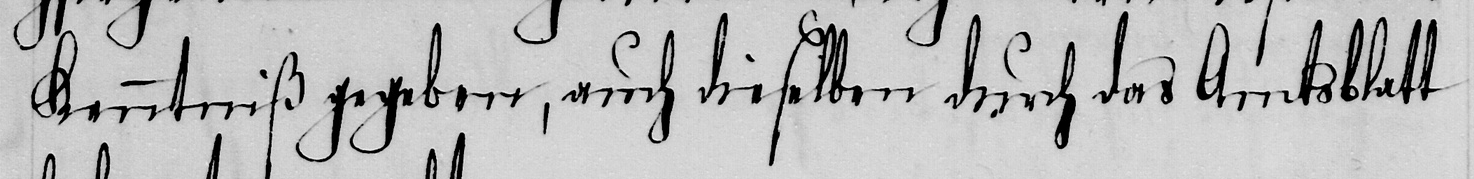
Kenntniß gegeben, auch dieselben durch das Amtsblatt
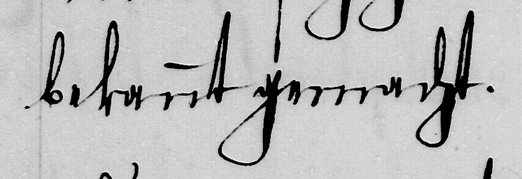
bekannt gemacht.
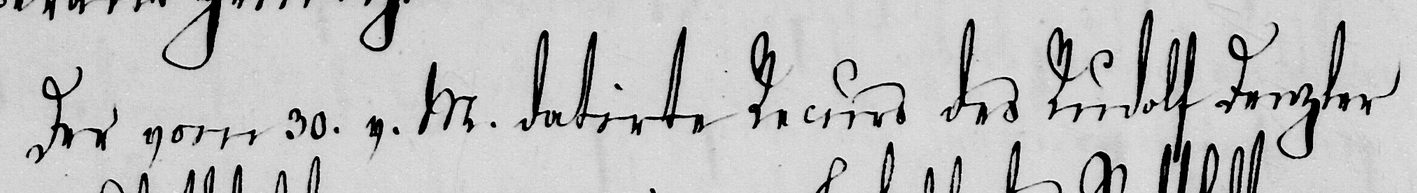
Der vom 30. v. M. datirte Recurs des Rudolf Denzler
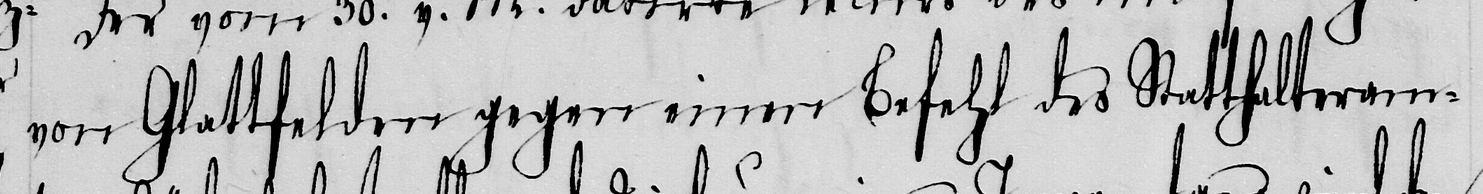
von Glattfelden gegen einen Befehl des Statthalteram¬
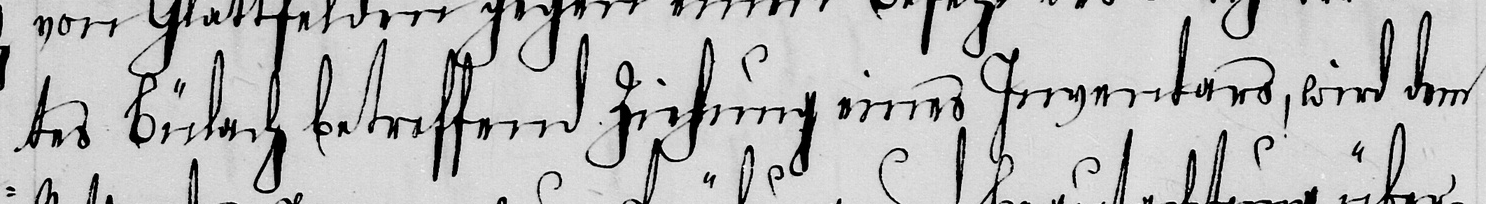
tes Bülach betreffend Ziehung eines Inventars, wird dem
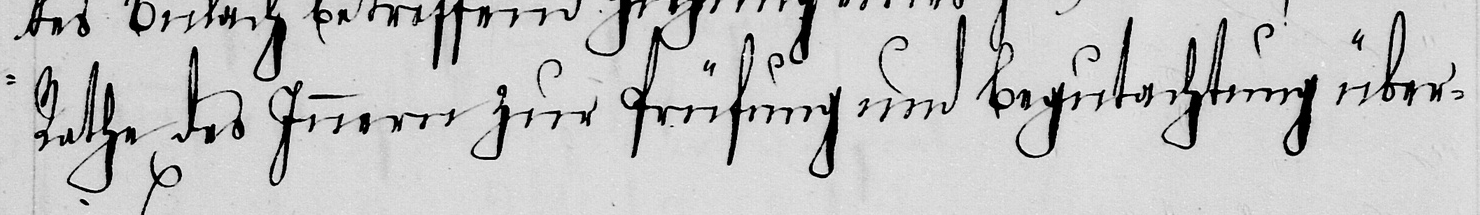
Rathe des Innern zur Prüfung und Begutachtung über¬
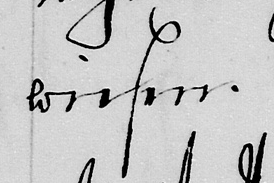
wiesen.
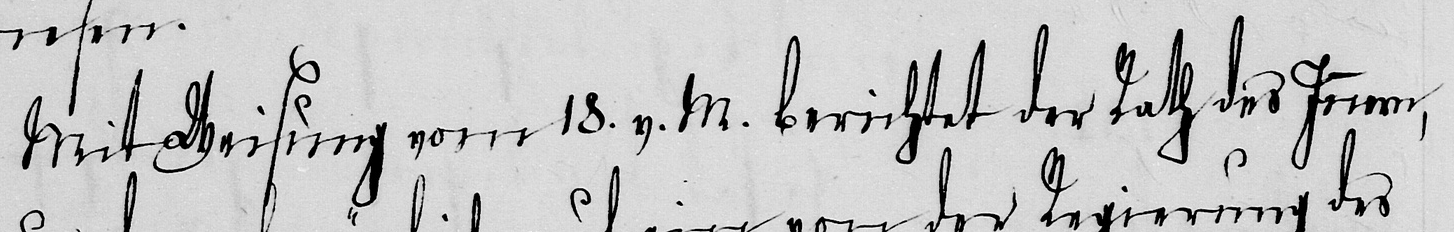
Mit Weisung vom 18. v. M. berichtet der Rath des Innern
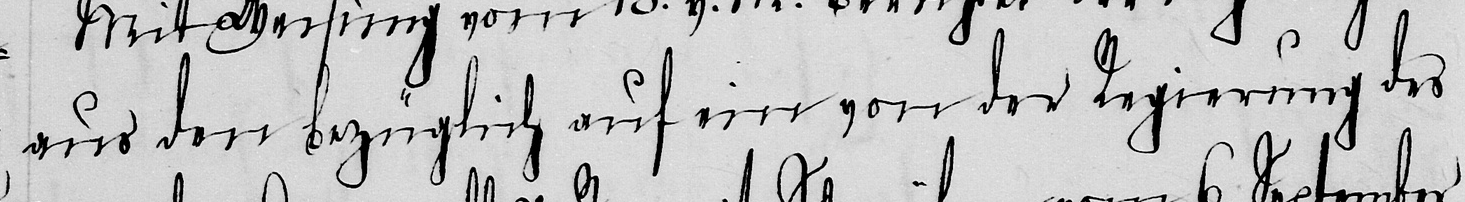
aus den bezüglich auf ein von der Regierung des
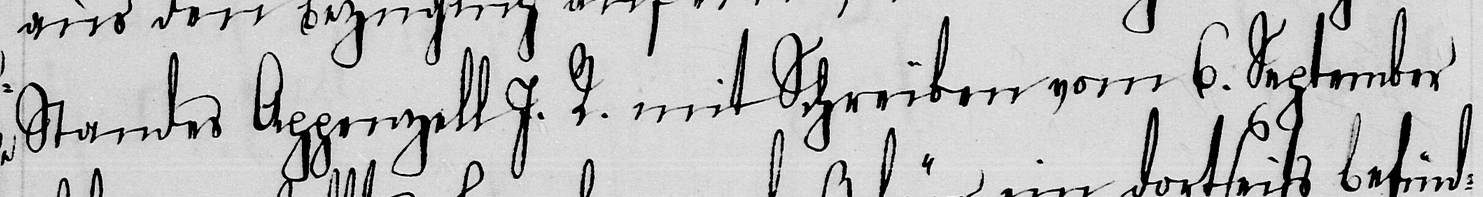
Standes Appenzell I. R. mit Schreiben vom 6. September
